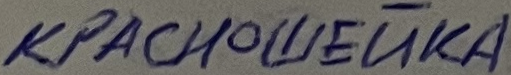красношейка
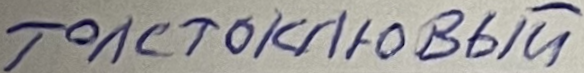толстоклювый
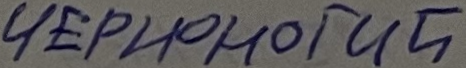черноногий
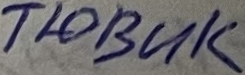тювик
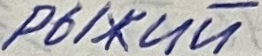рыжий
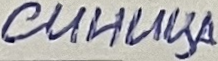синица
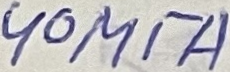чомга
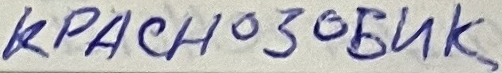краснозобик
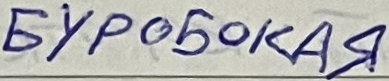буробокая
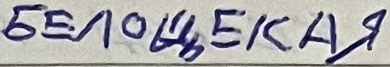белощёкая
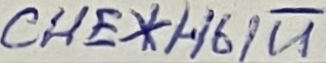снежный
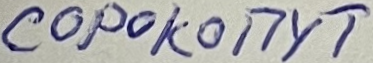сорокопут
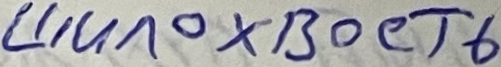шилохвость
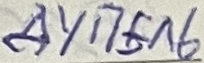дупель
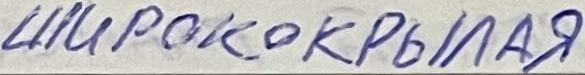ширококрылая
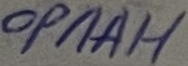орлан
